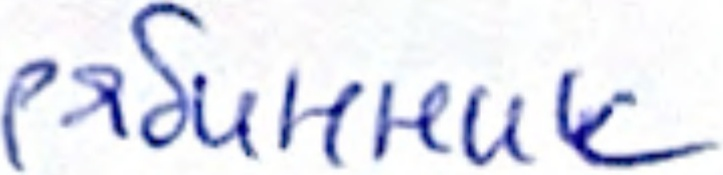рябинник
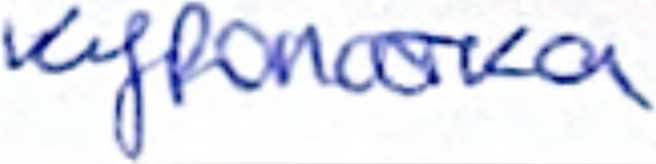куропатка
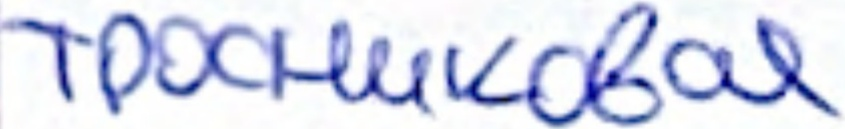тросниковая
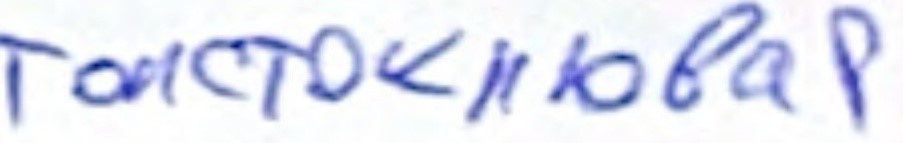толстоклювая
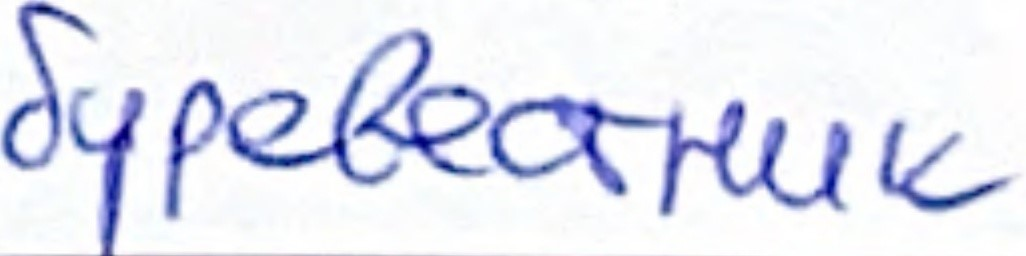буревестник
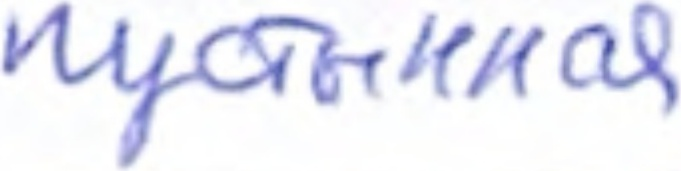пустынная
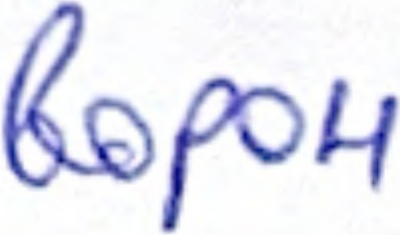ворон
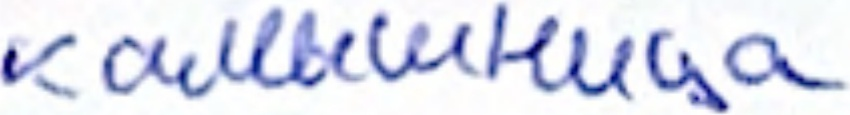камышница
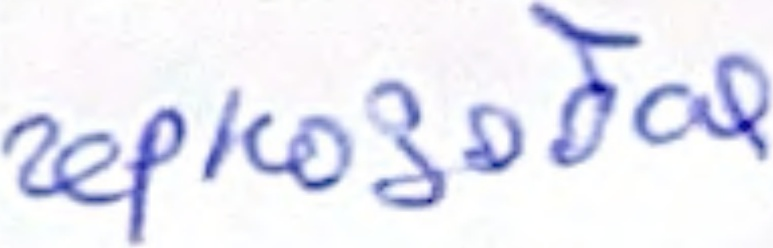чернозобая
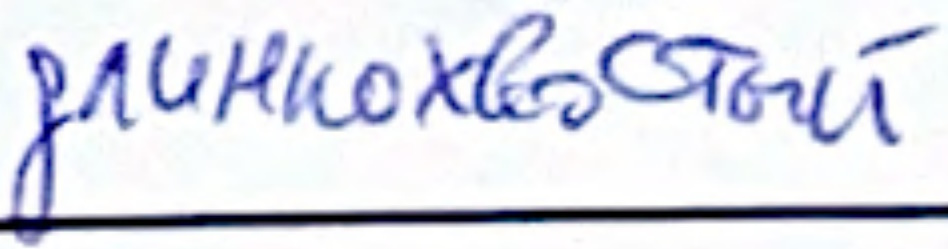длиннохвостый
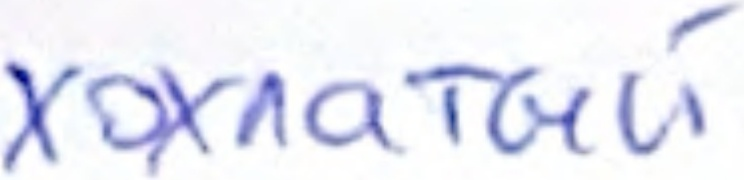хохлатый
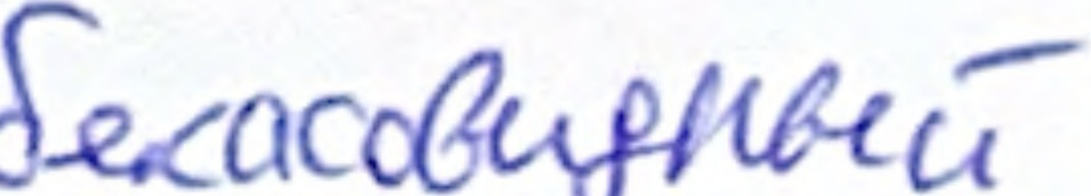бекасовидный
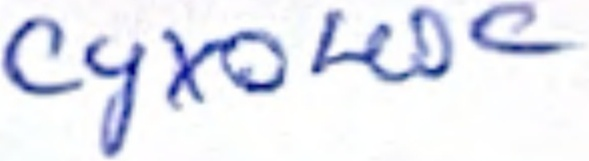сухонос
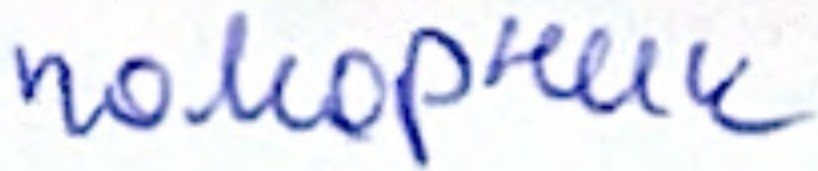поморник
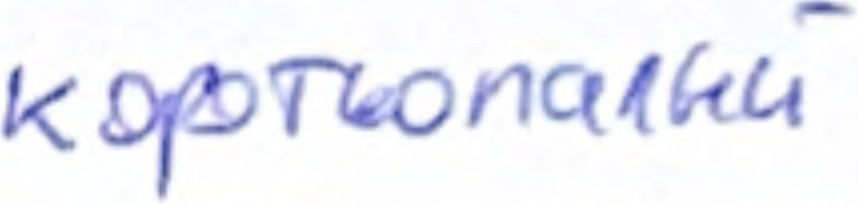короткопалый
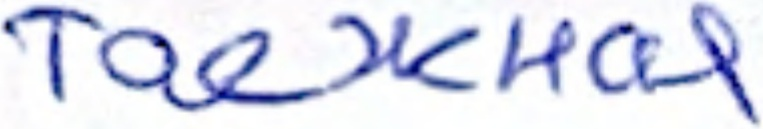таежная
